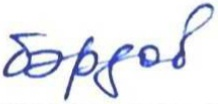бэрдов
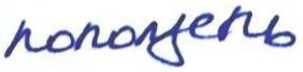поползень
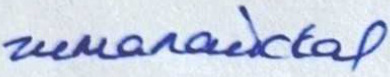гималайская
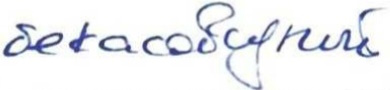бекасовидный
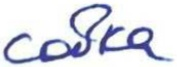совка
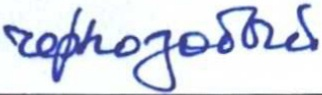чернозобый
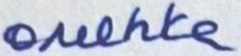оляпка
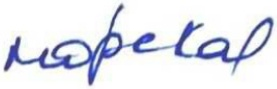морская
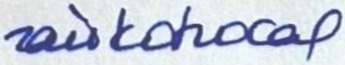чайконосая
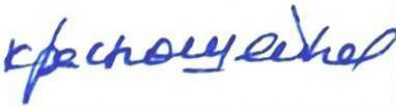красношейная
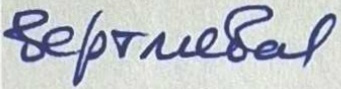вертлявая
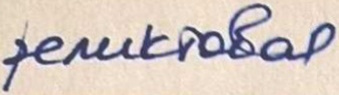реликтовая
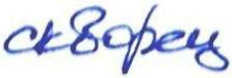скворец
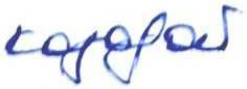козодой
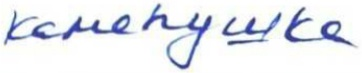каменушка
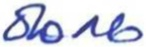бюль
